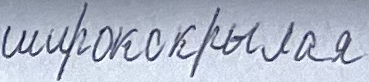ширококрылая
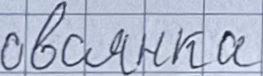овсянка
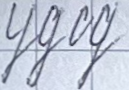удод
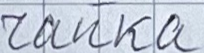чайка
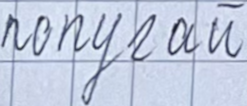попугай
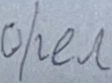орел
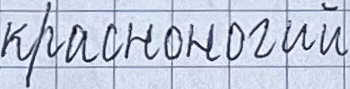красноногий
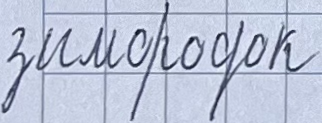зимородок
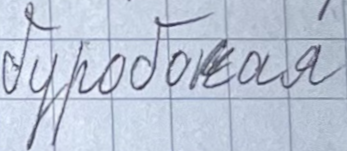буробокая
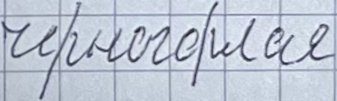черногорлая
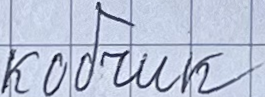кобчик
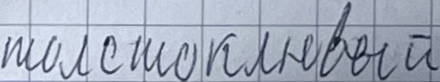толстоклювый
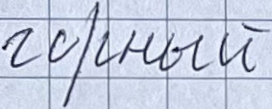горный
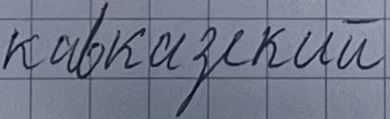кавказский
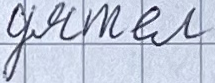дятел
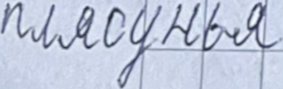плясунья
